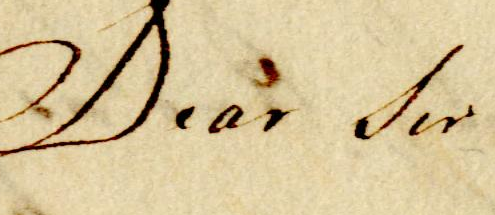Dear Sir
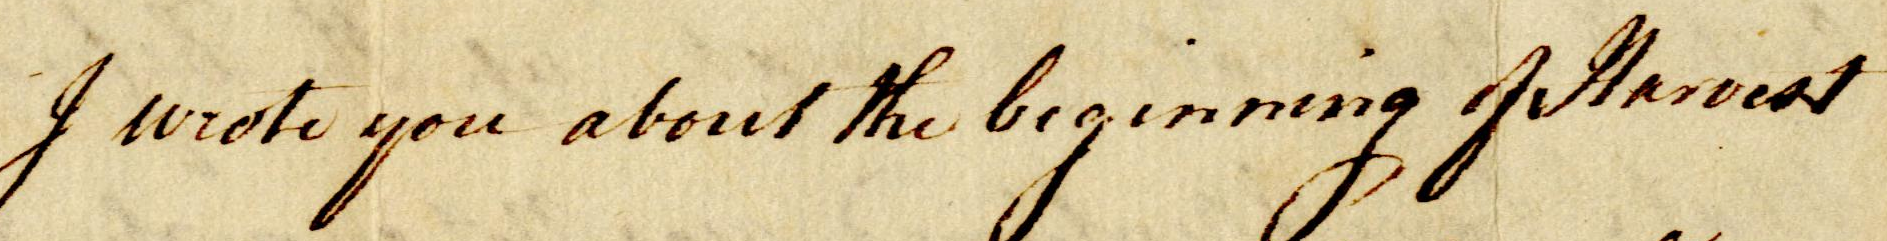I wrote you about the beginning of August
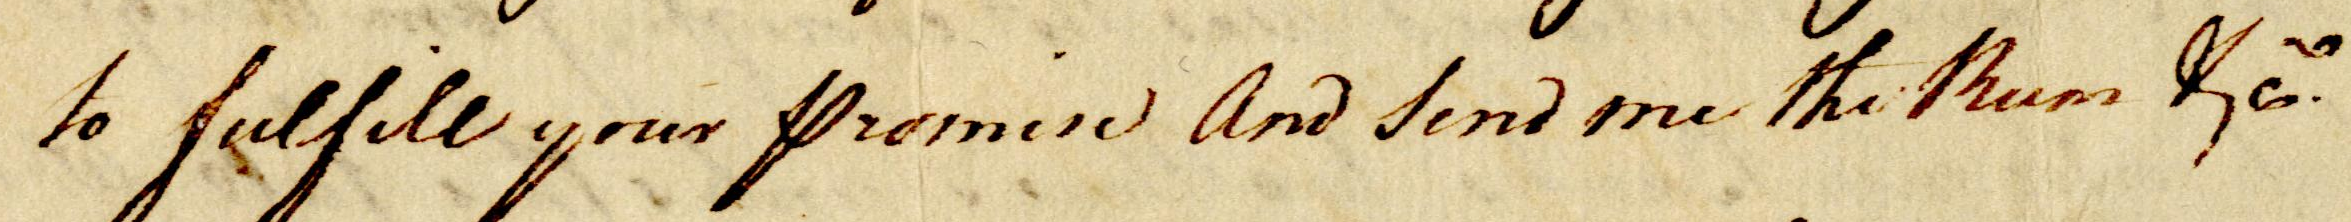to fulfill your promise And Send me the Rum &c^a.
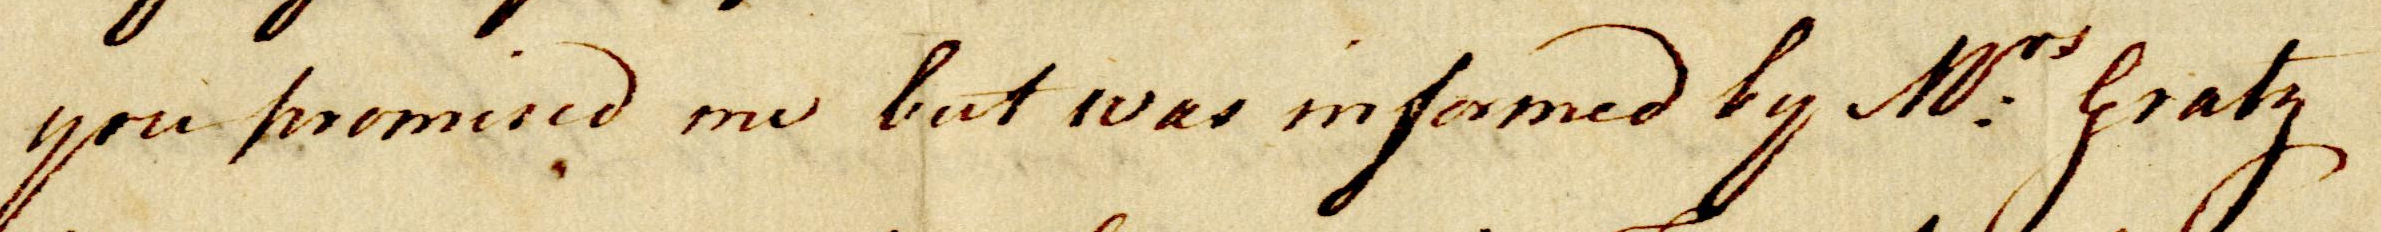you promised me but was informed by M^rs: Gratz
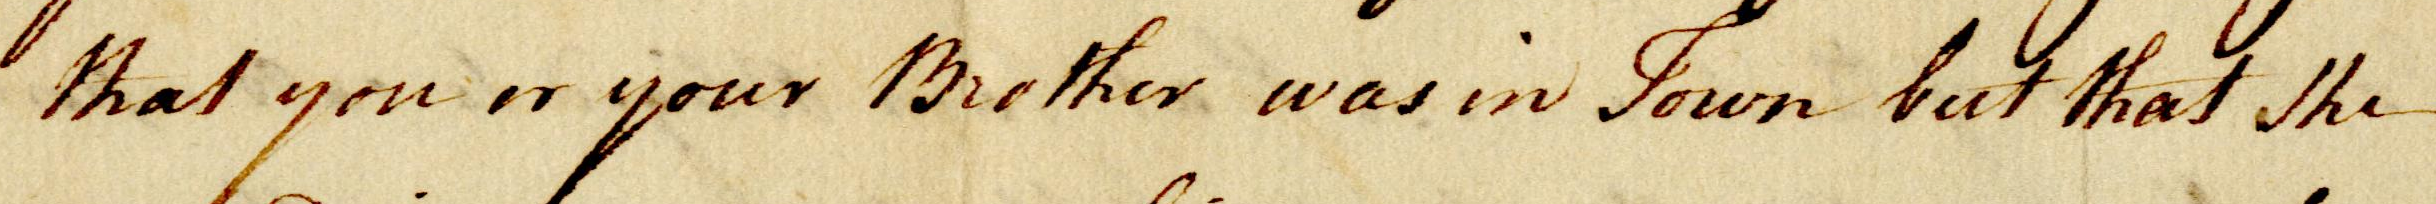that you or your Brother was in Town but that she
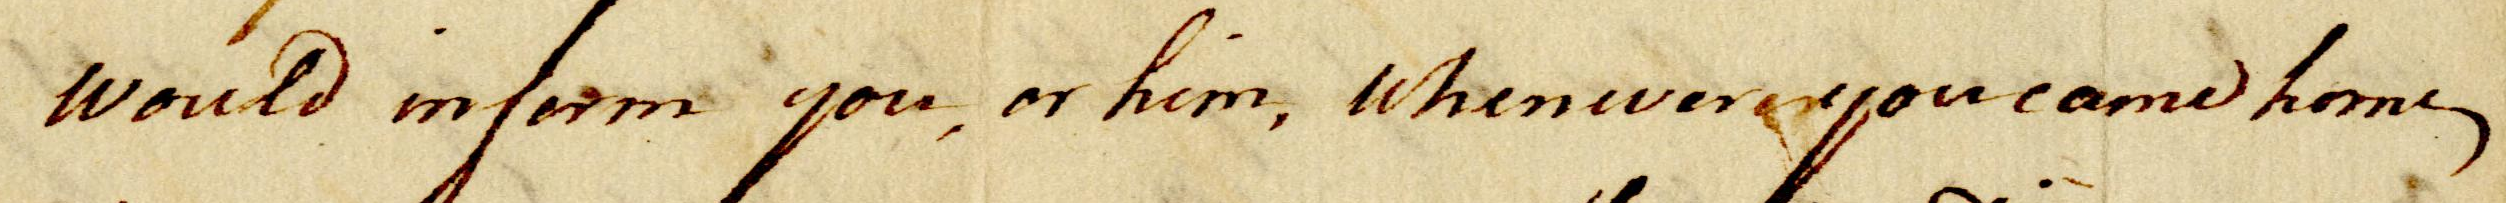would inform you, or him, whenever you came home
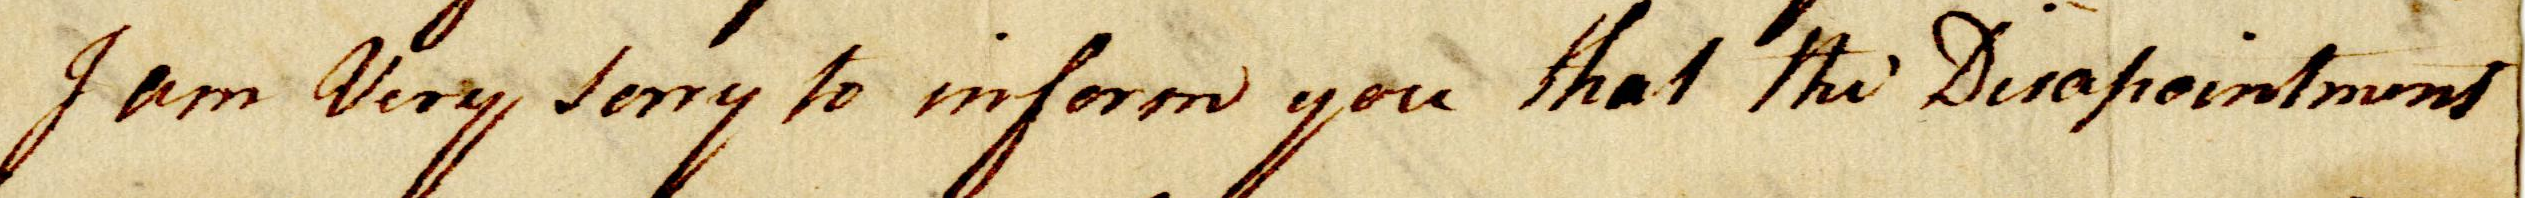I am Very sorry to inform you that the Disappointment
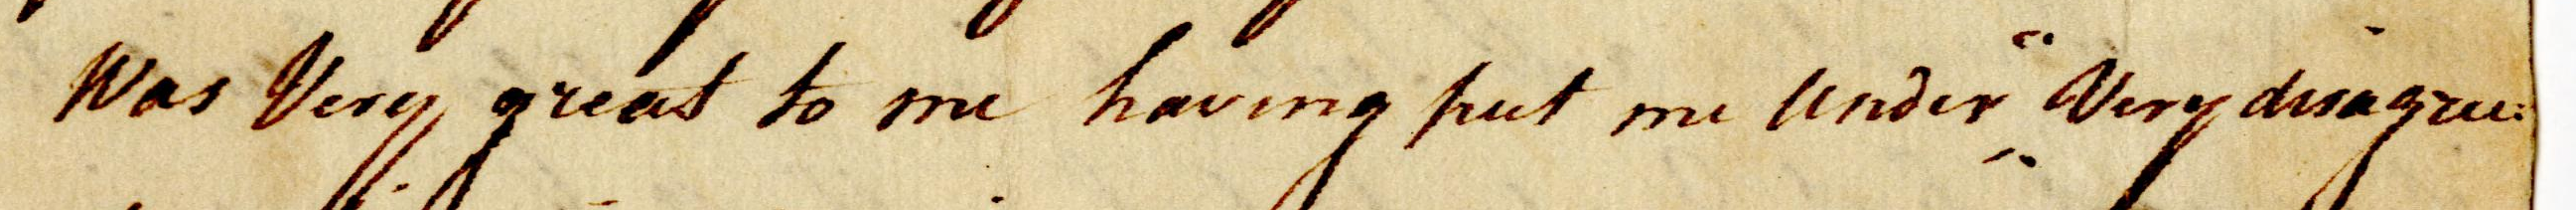Was Very great to me having put me Under Very disagree-
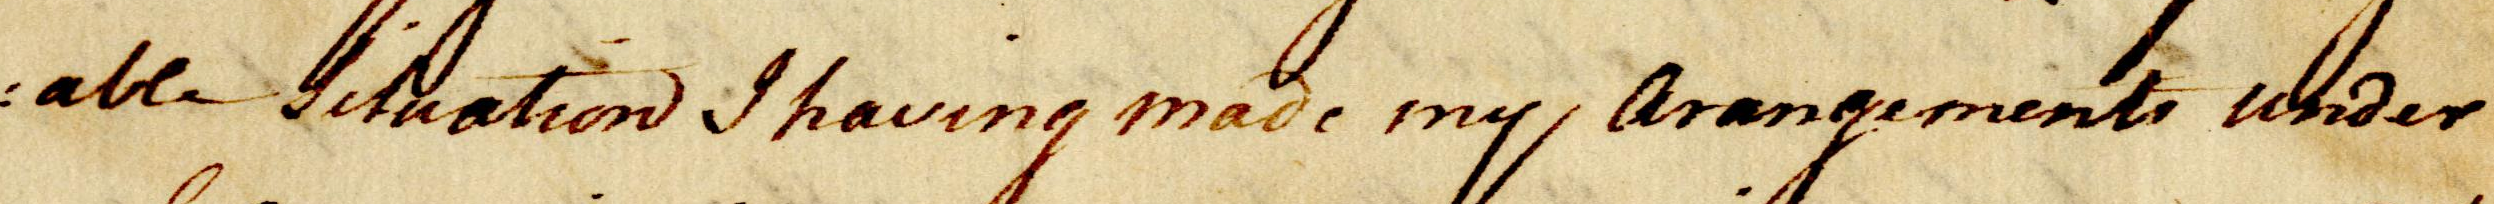-able Situation I having made my Arrangements under
